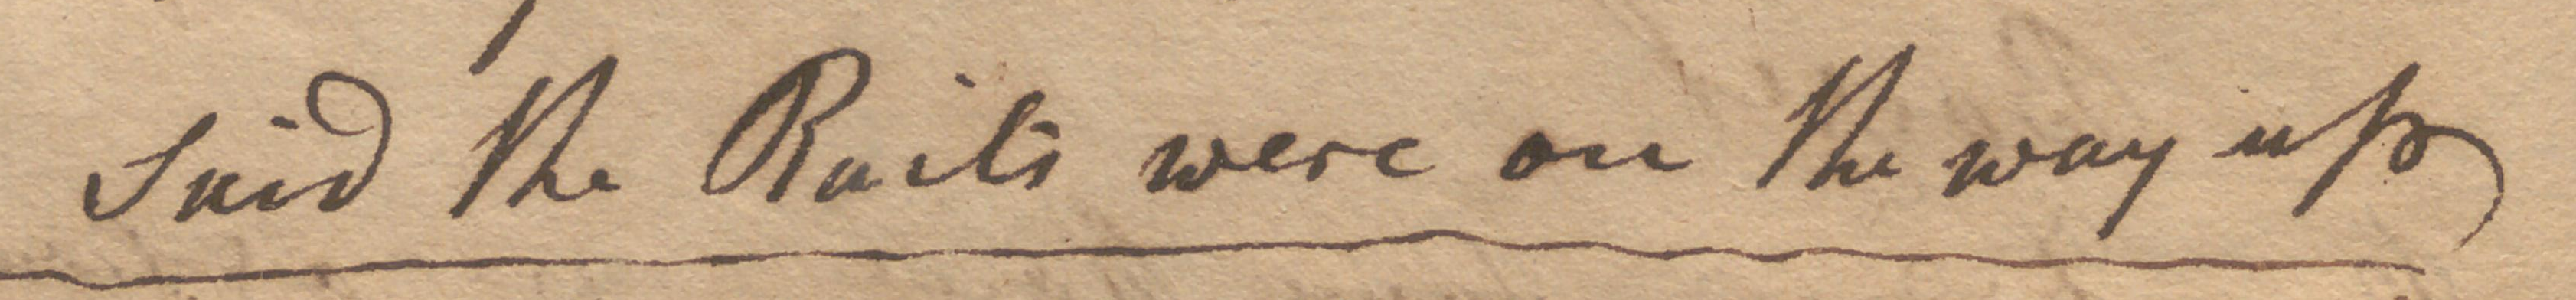said the Rails were on the way up
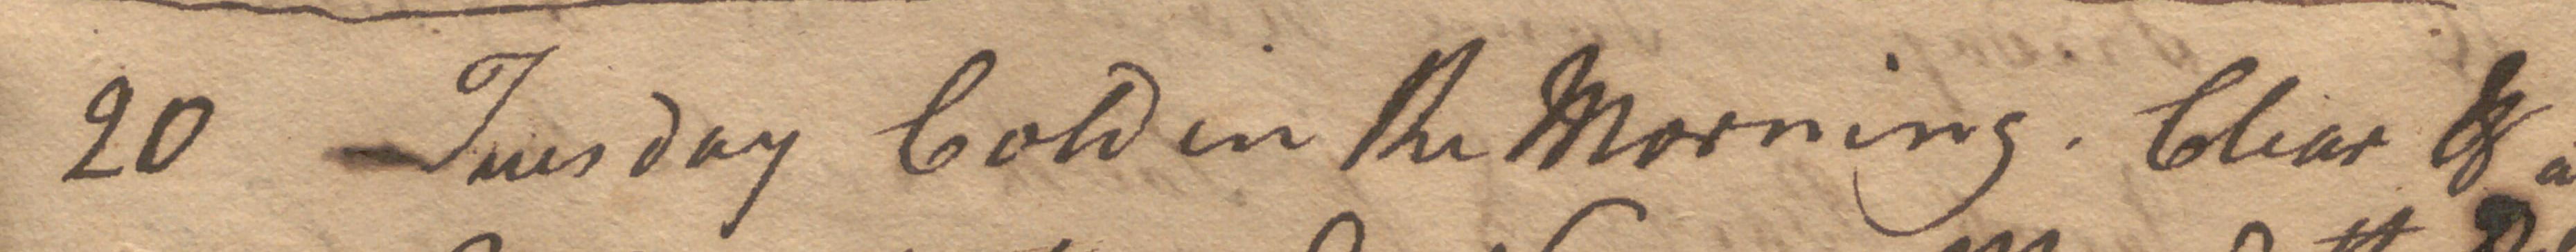20 Tuesday Cold in the Morning. Clear &
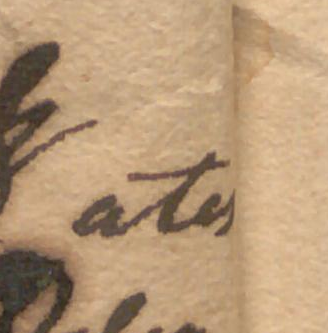ates
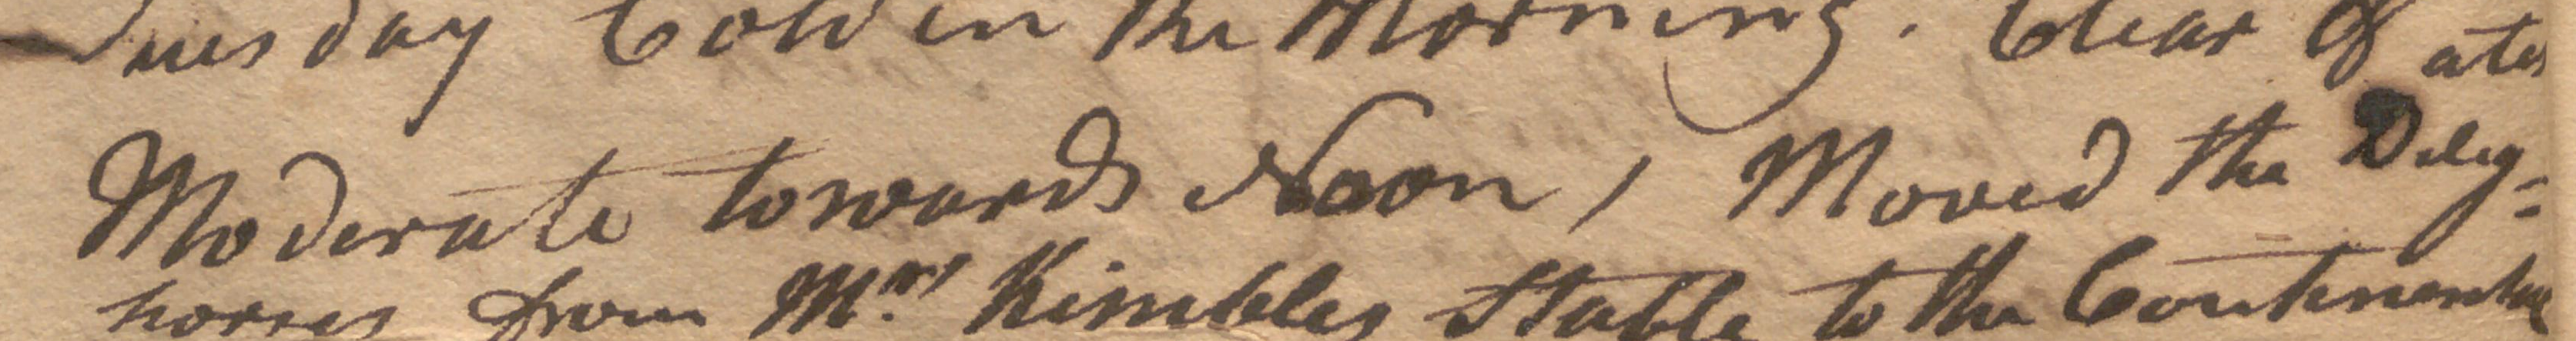Moderate towards Noon, Moved the Deleg-
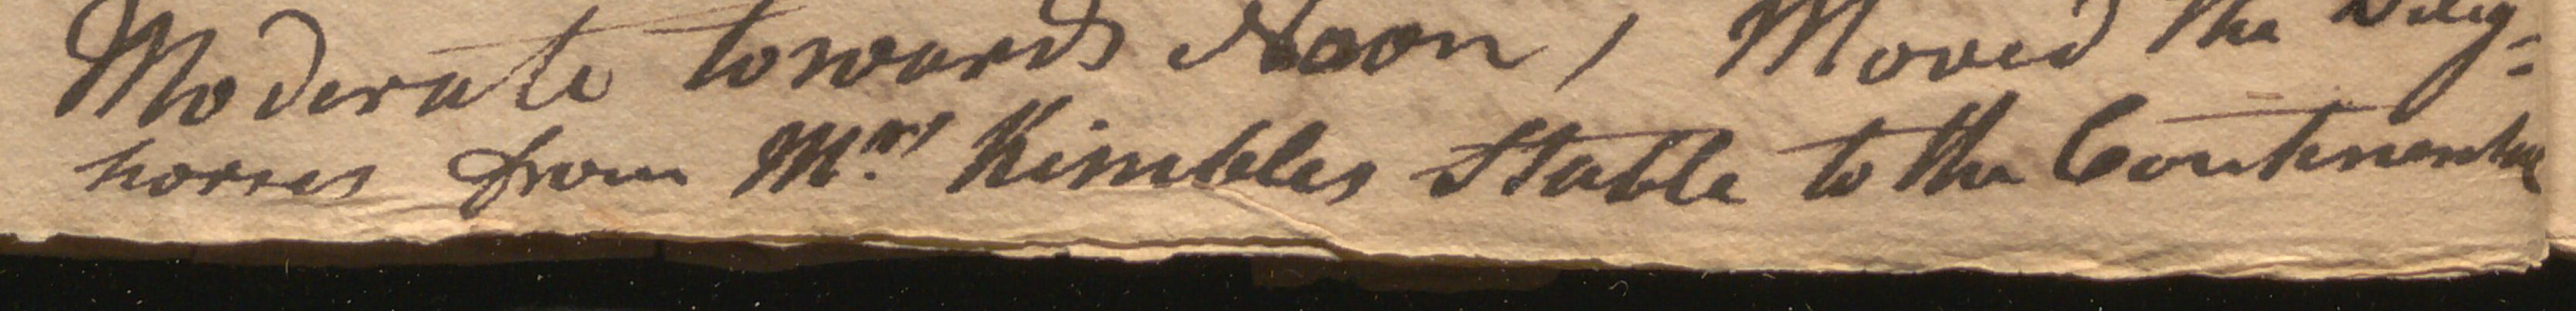hores frou M^r. Kimbles Stable to the Continental
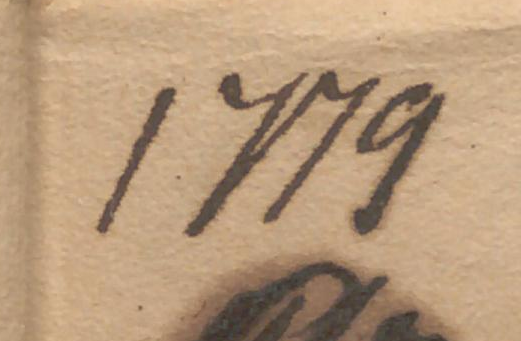1779
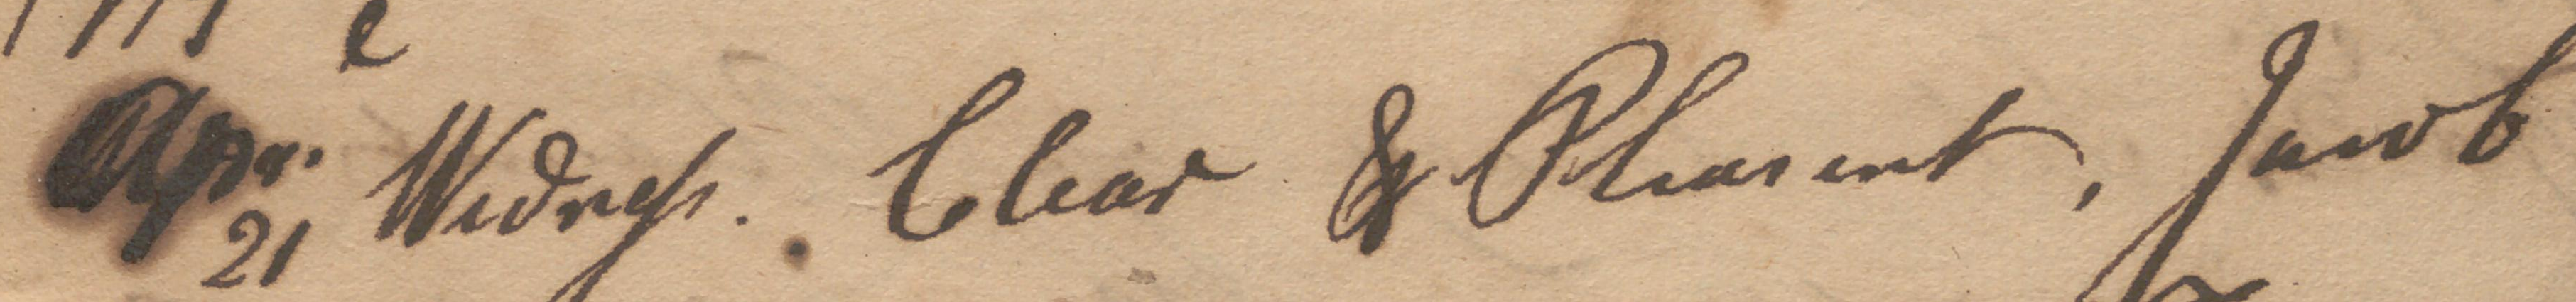Apr^l 21 Wedness. Clear & Pleasent, Jacob
